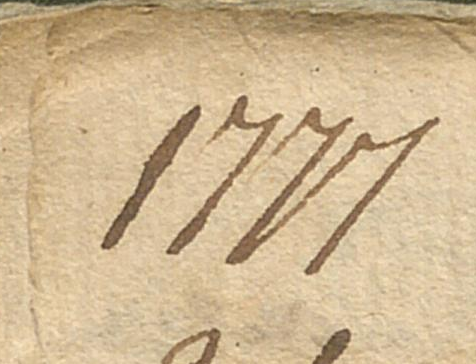1777
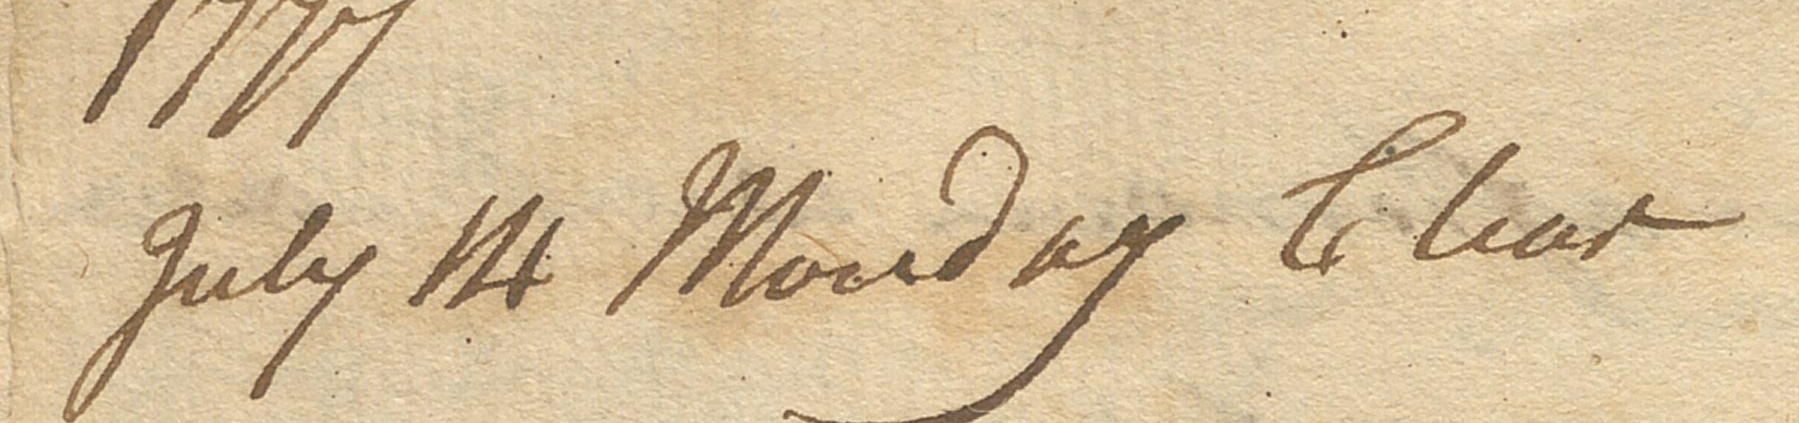July 1 Monday Clear
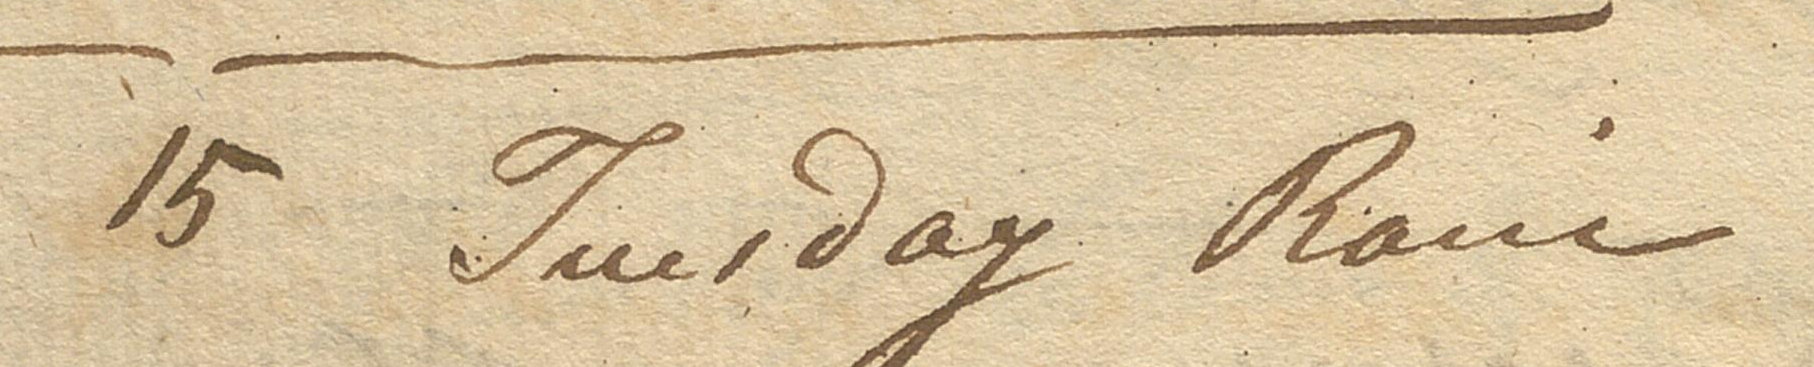15 Tuesday Rain
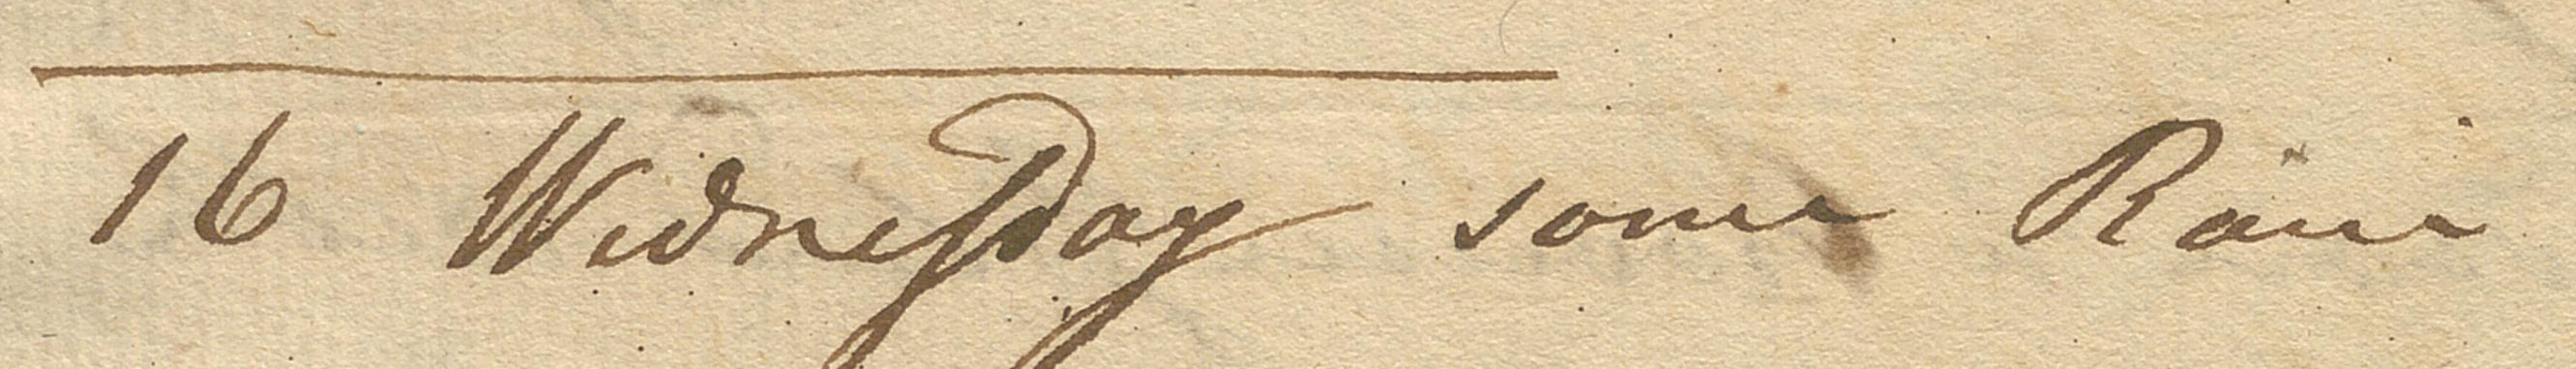16 Wednesday some Rain
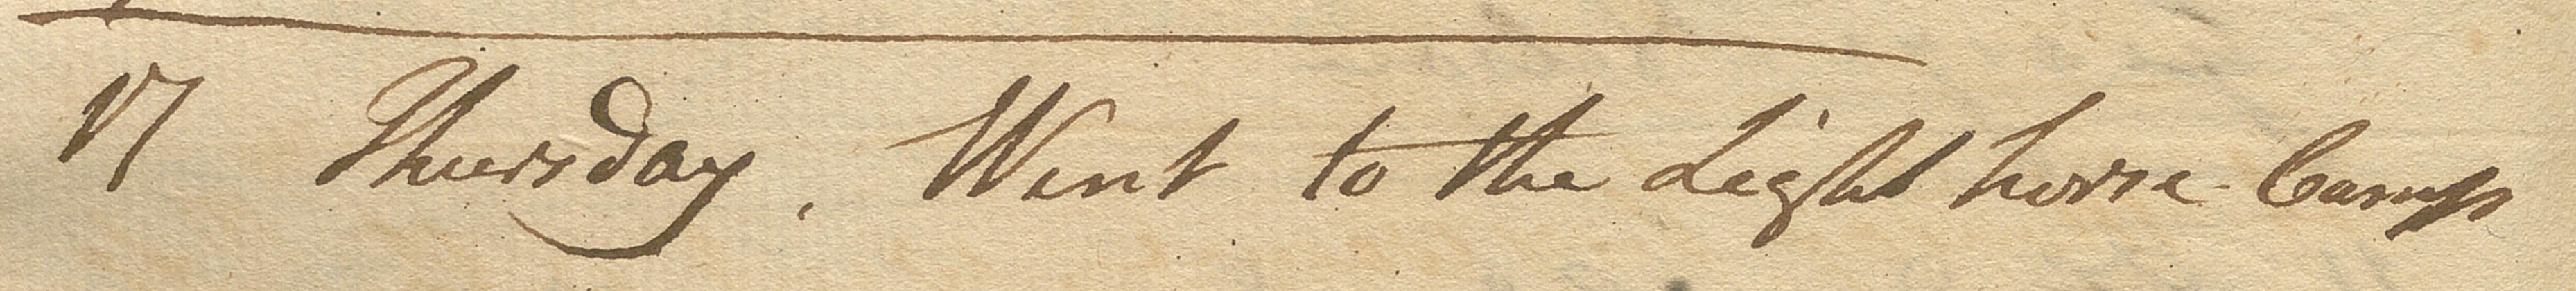17 Thursday, Went to the Light horse Camp
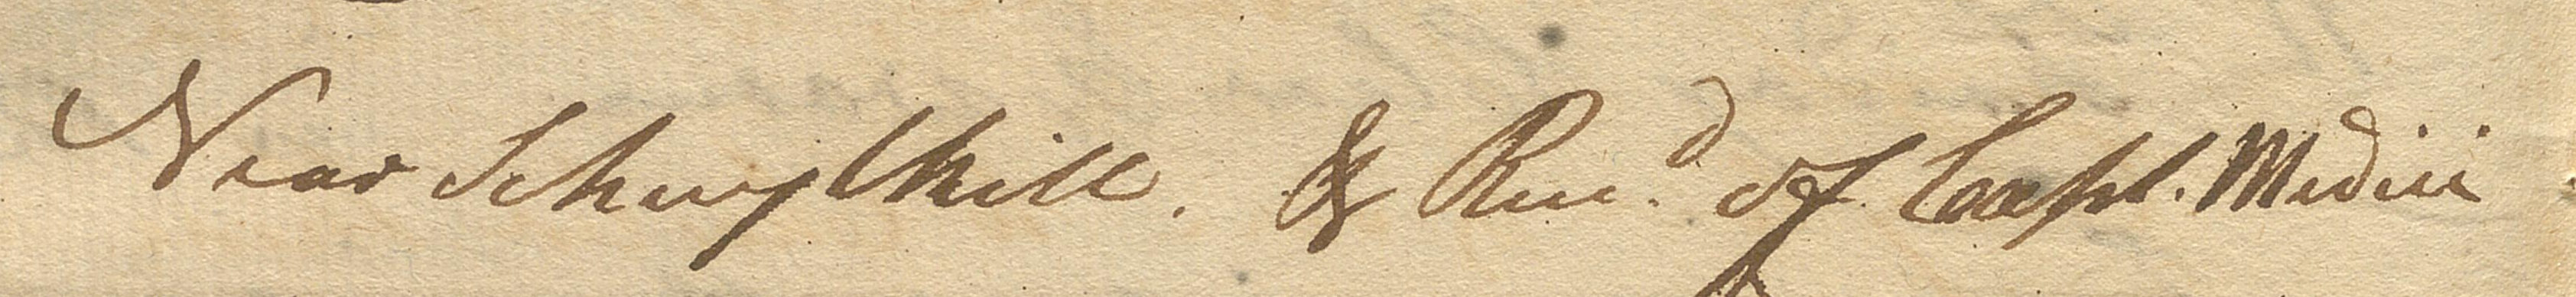Near Schuylkill. & Rec^d. of Capt. Medici
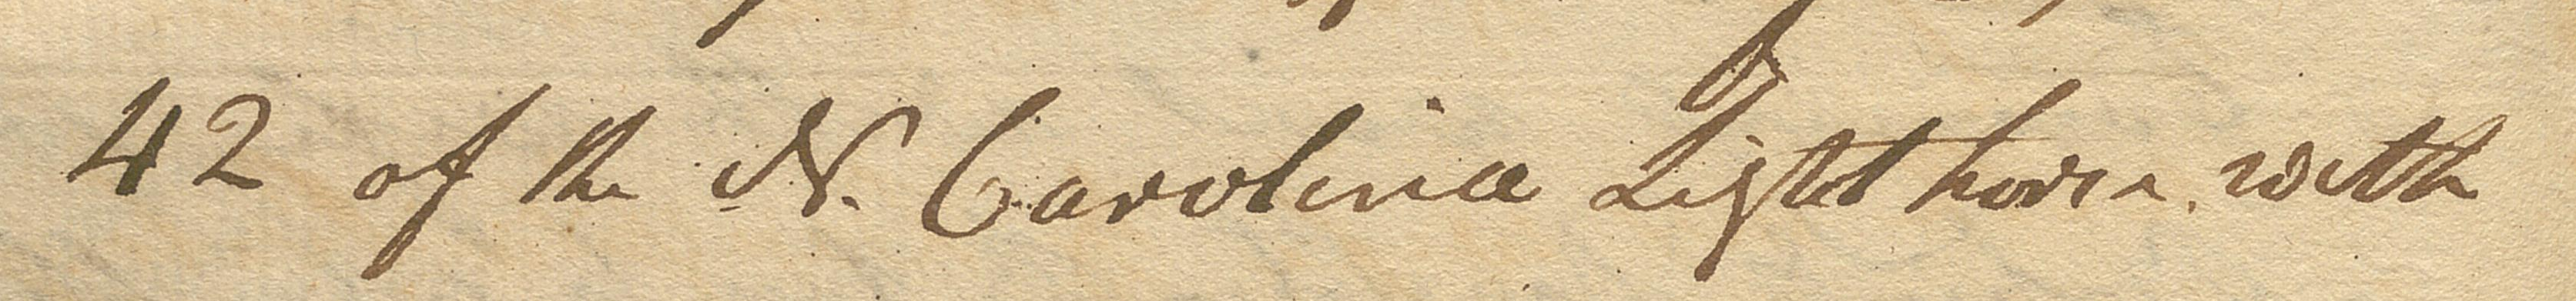42 of the N^r. Carolina Light horse with
